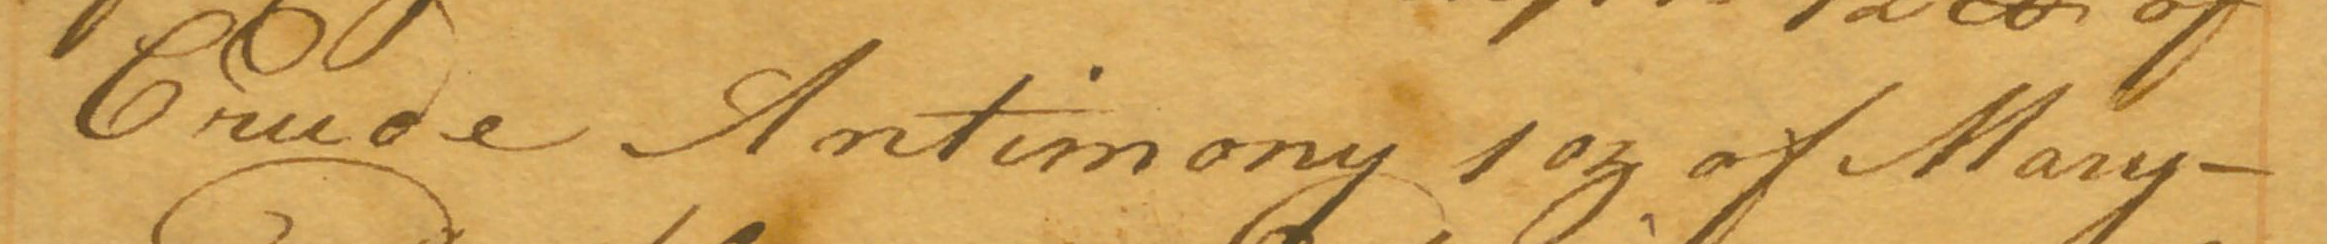Crude Antimony 1 oz of Mary-
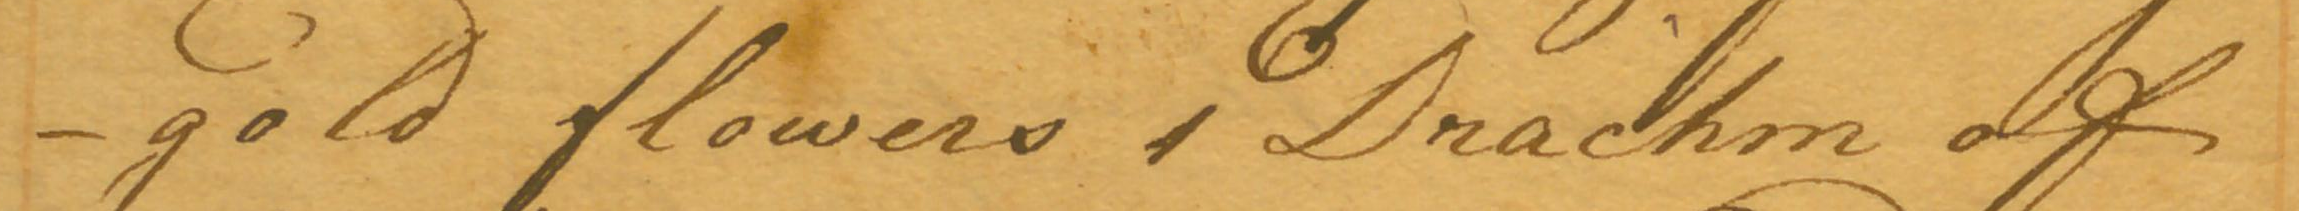-gold flowers 1 Drachm of
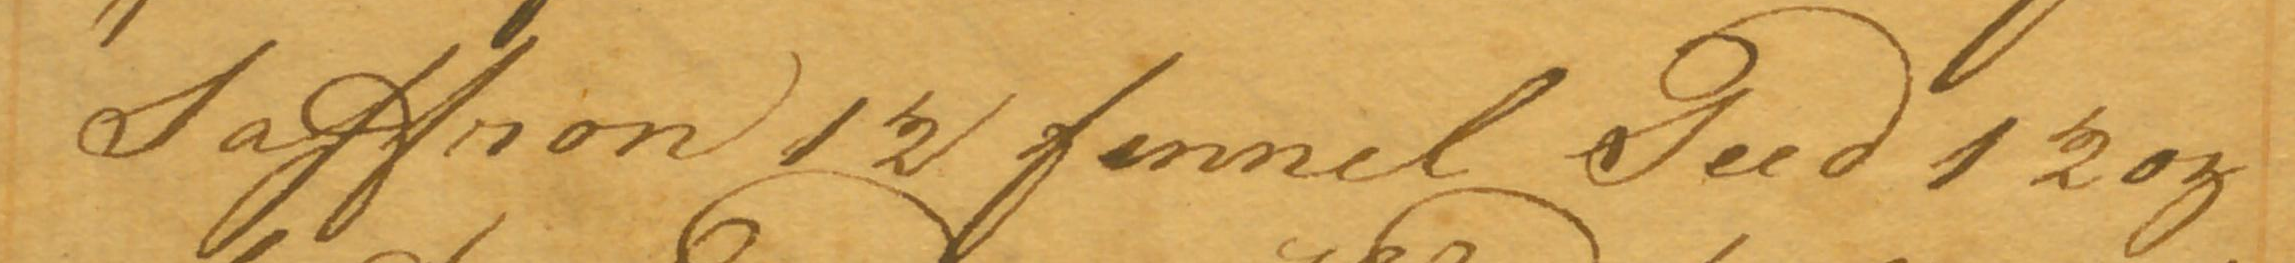Safron 1 1/2 fennel seed 1 1/2 oz
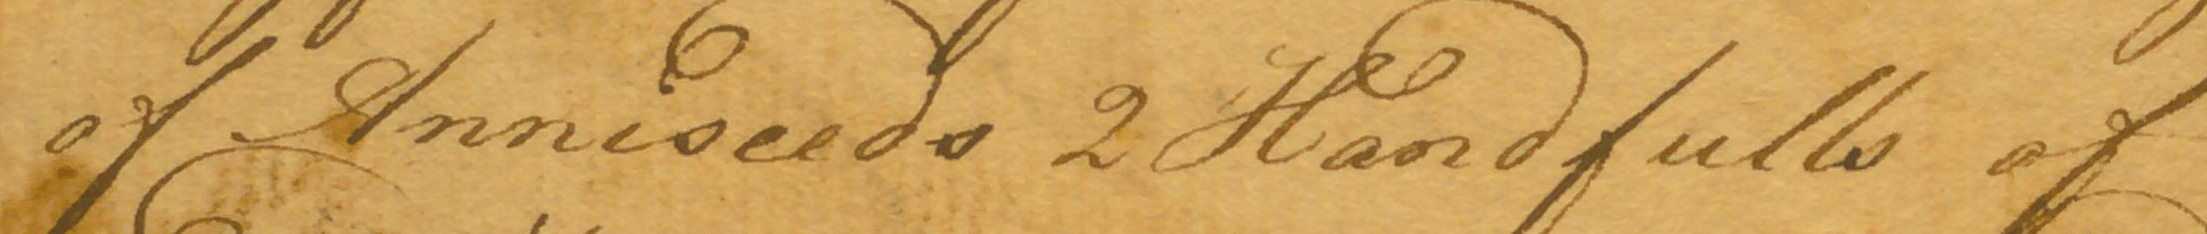of Anniseeds 2 Handfulls of
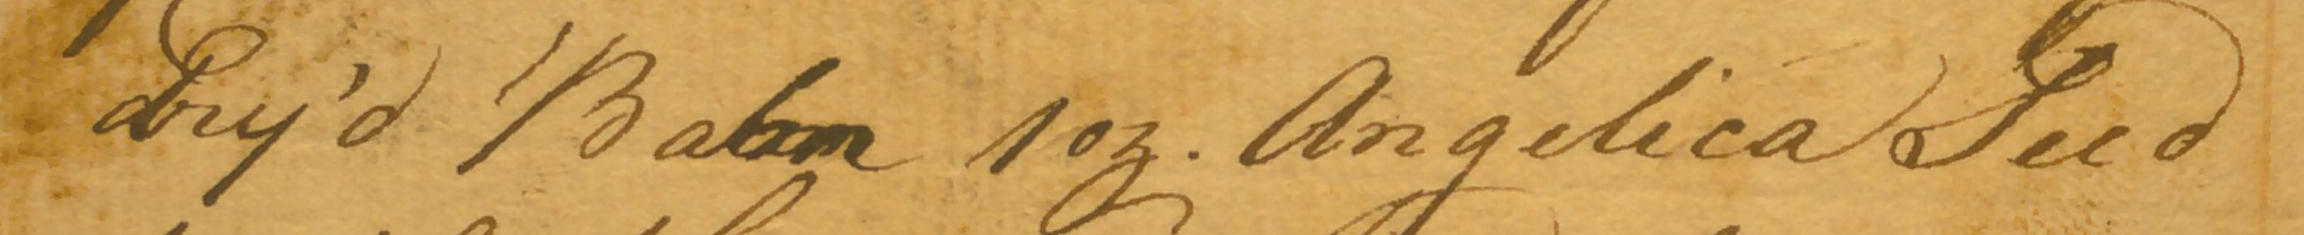dry'd Balm 1 oz. Angelica Seed
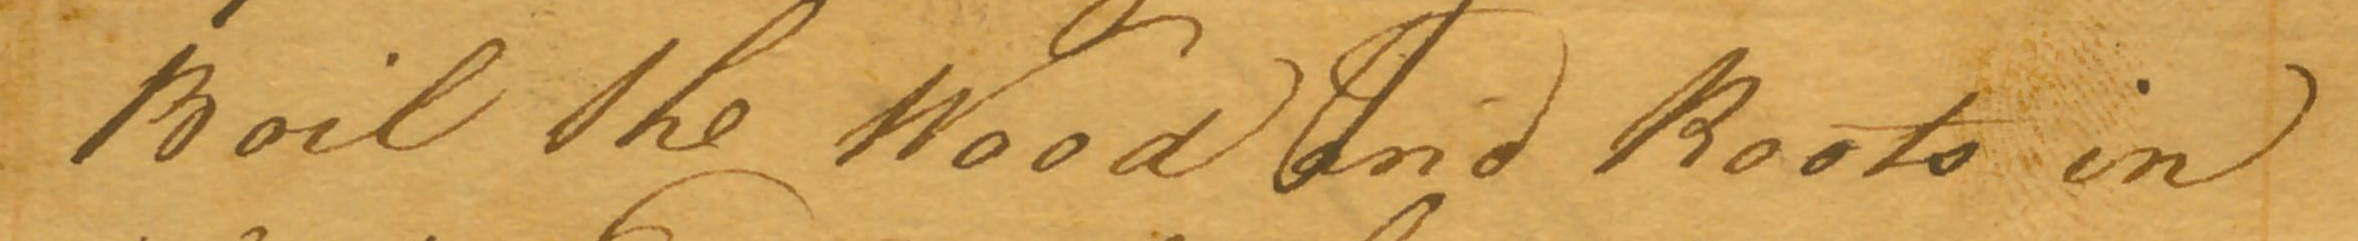Boil the Wood and Roots in
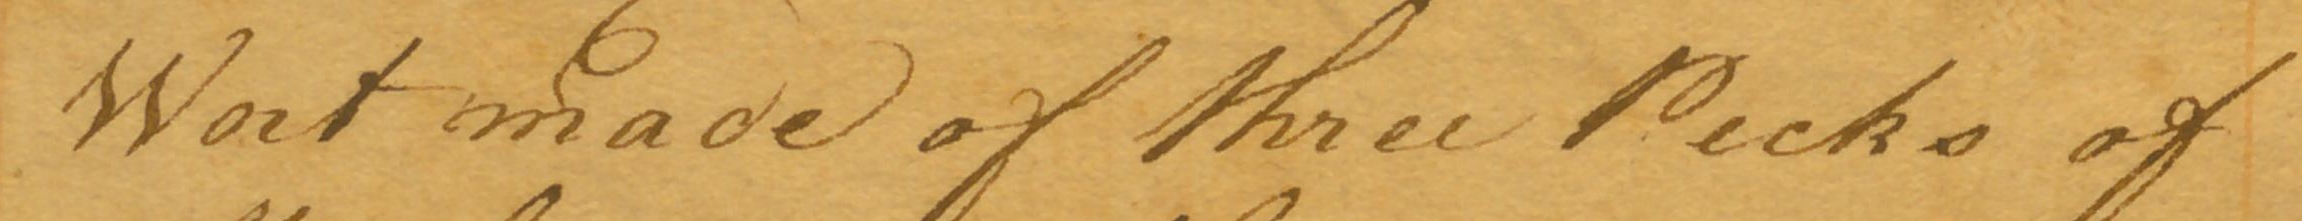Wort made of three Pecks of
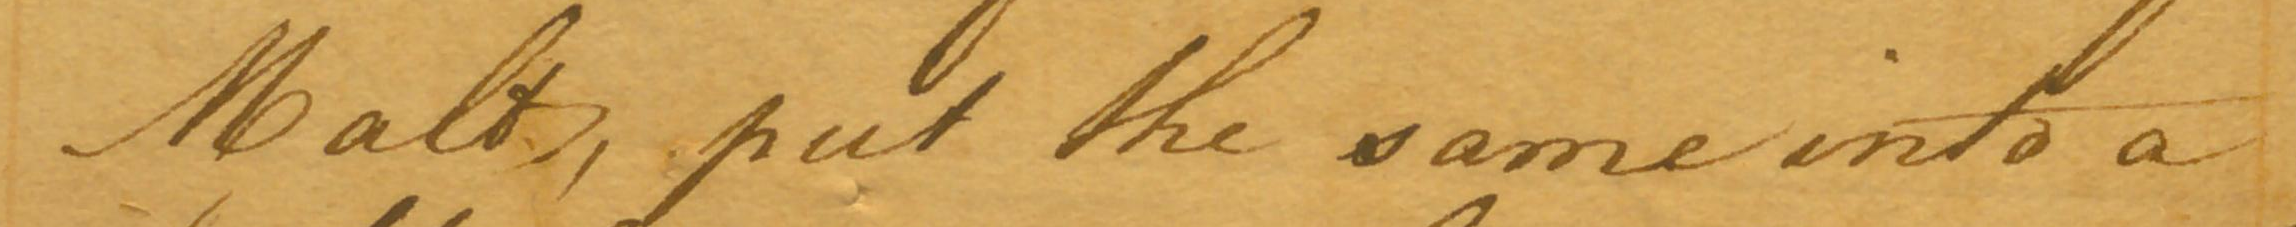Malt, put the same into a
